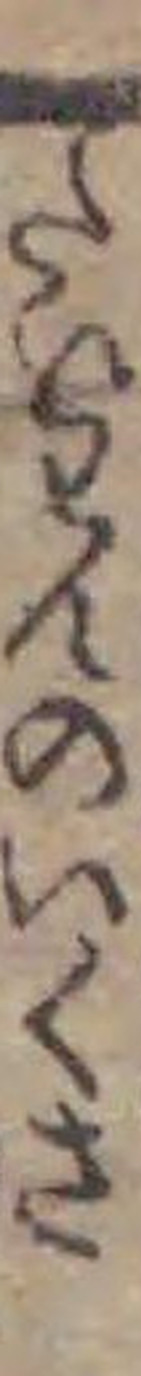たいわんのいくさ
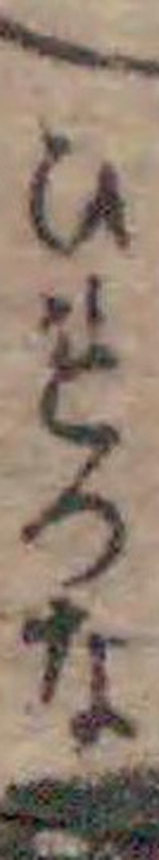ひれつな
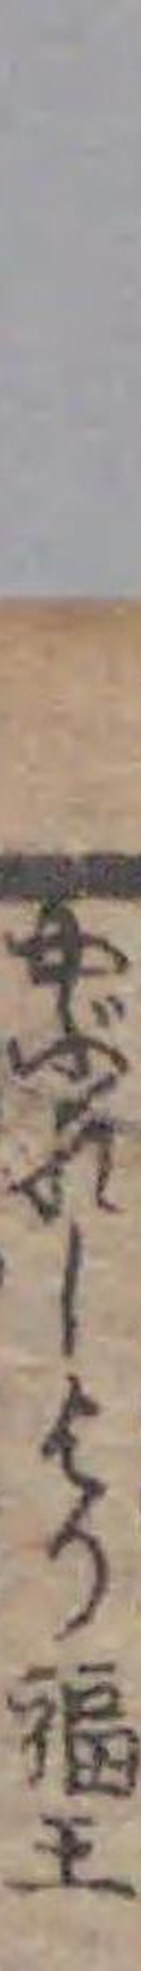やぶれしより福王
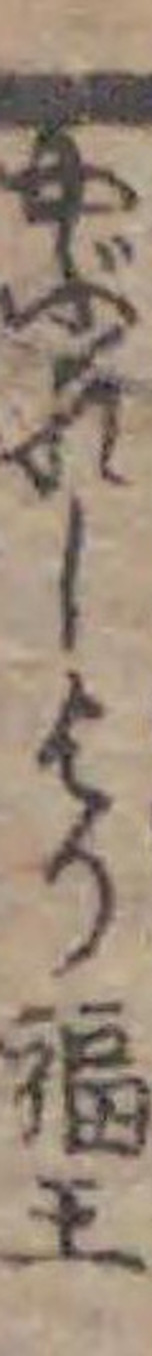やぶれしより福王
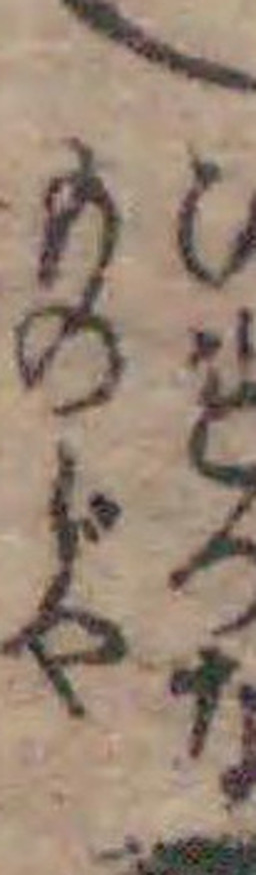ものじや
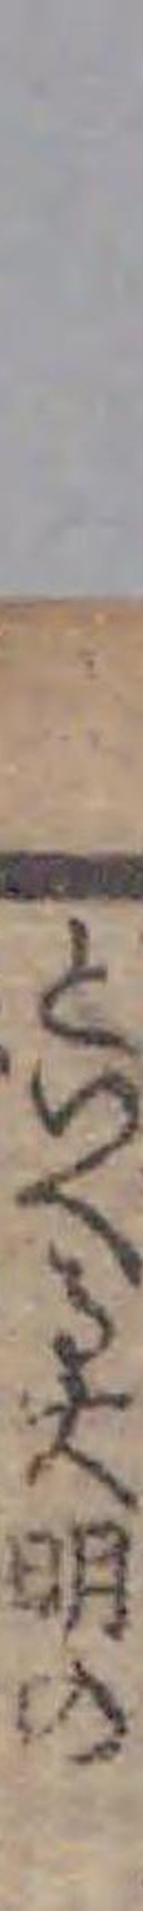といへる大明の
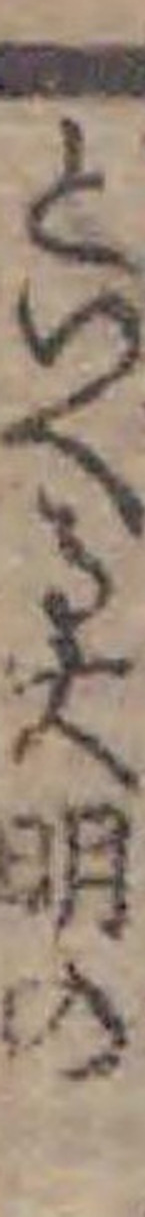といへる大明の
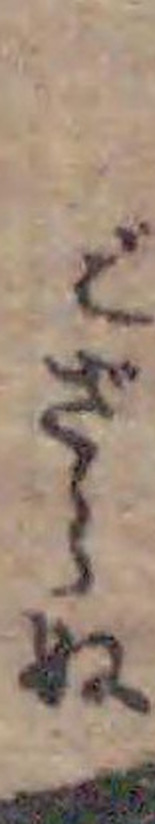ござらぬ
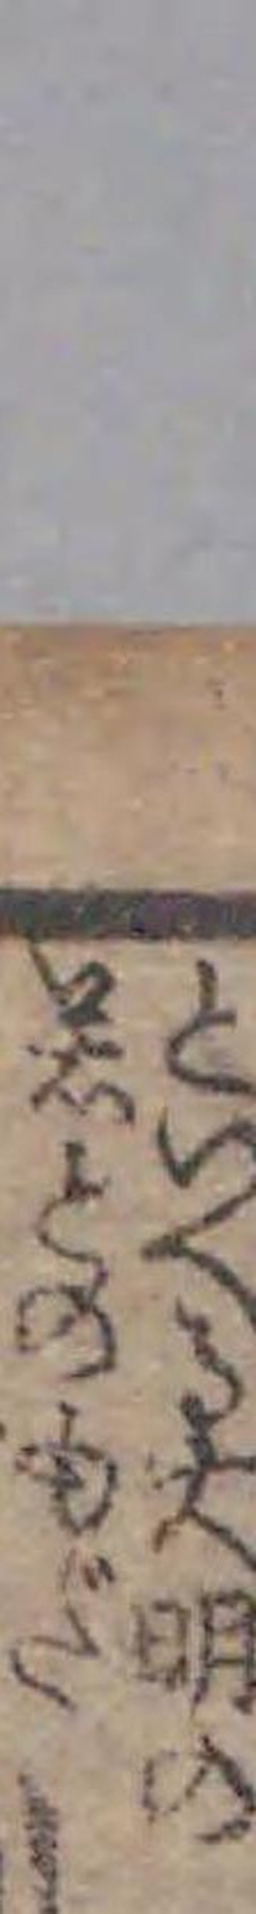若とのもだ
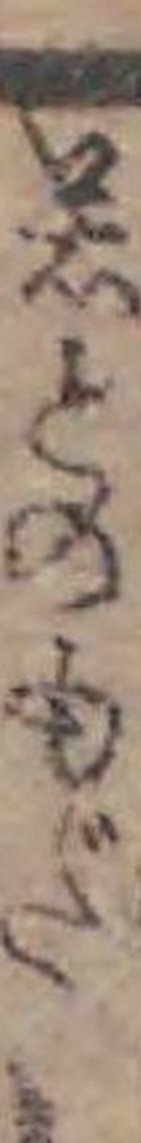若とのもだ
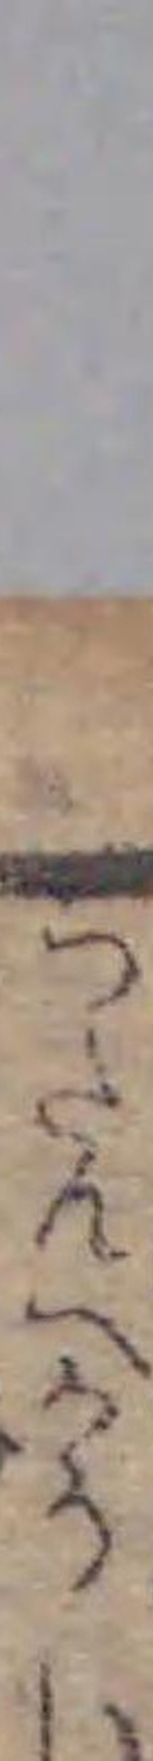つたんへかう
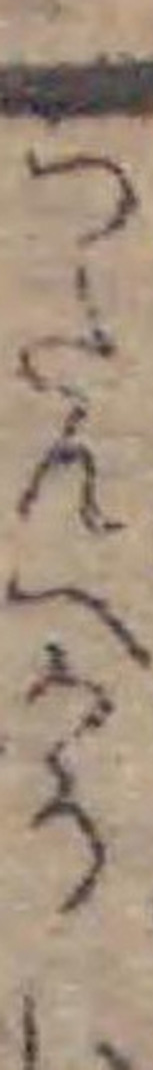つたんへかう
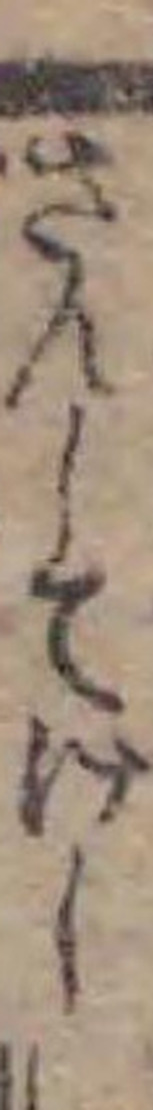さんしてけし
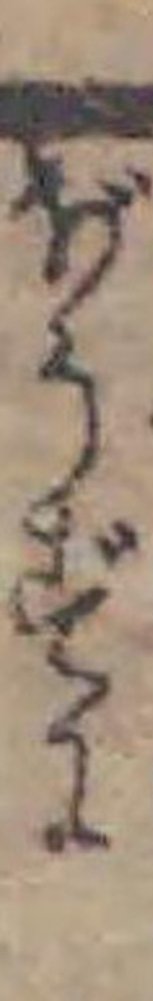ぼうずに
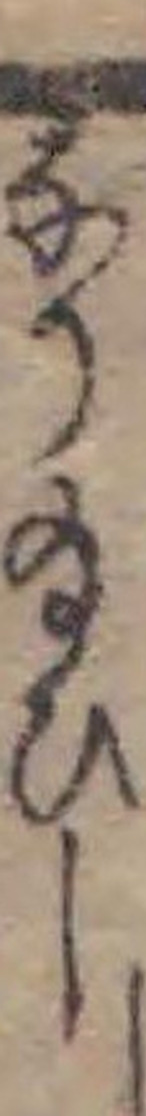なり給ひし
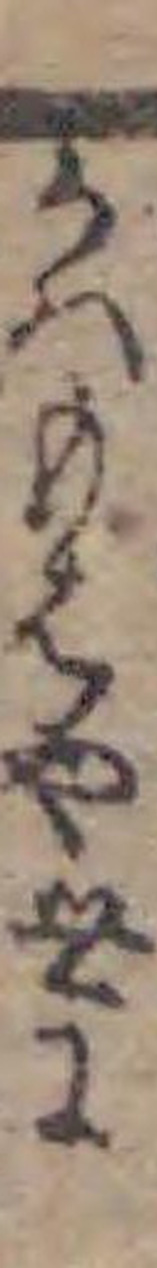かはもはや世に
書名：此奴和日本 : 2巻
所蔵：国立国会図書館 National Diet Library, JAPAN
